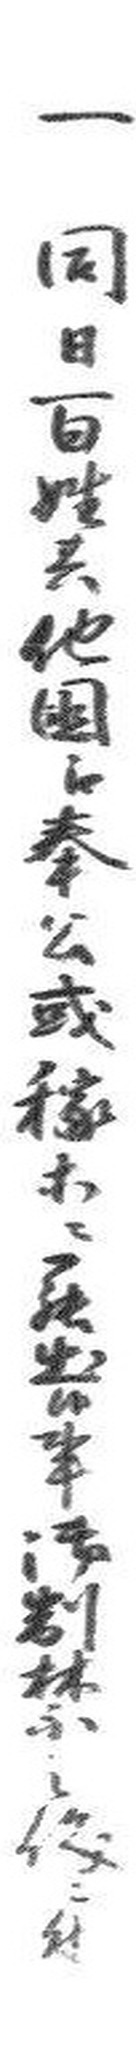一同日百姓共他国江奉公或稼等ニ罷出候事御制禁之儀ニ付
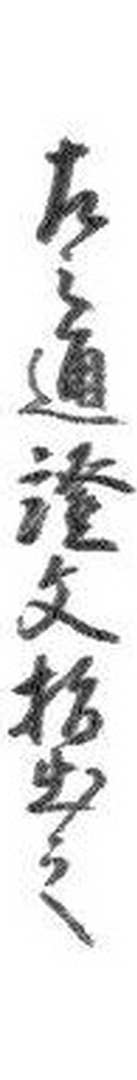左之通証文指出之
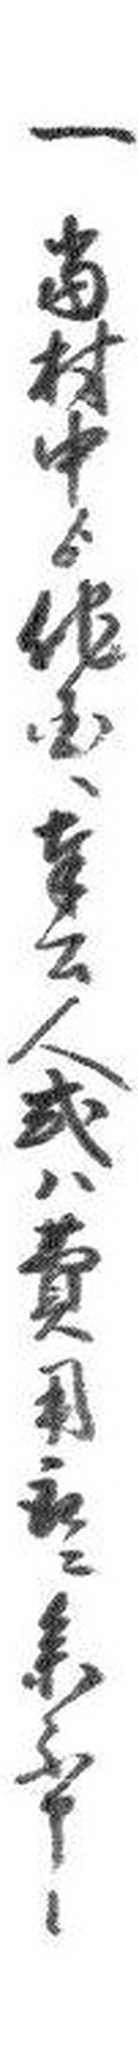一当村中ゟ他国ヘ奉公人或ハ費用取ニ参不申候
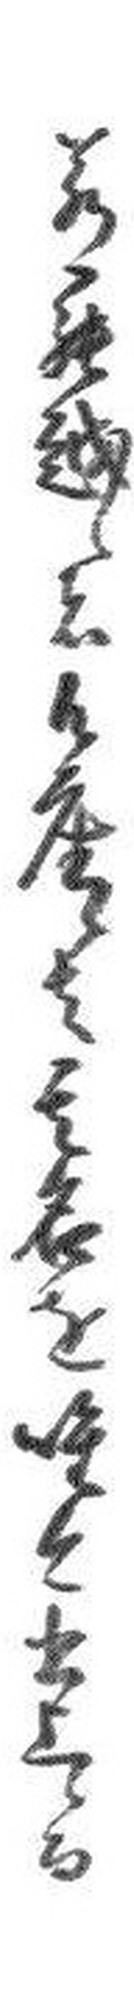若罷越候者御座候は其名を唯今書上候而
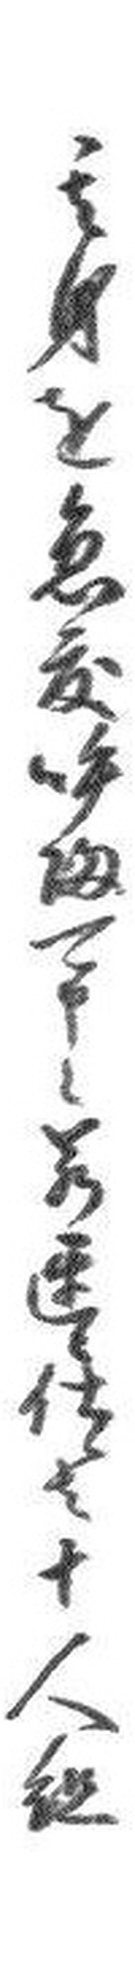其身を急度呼帰可申候若遅ニ仕候は十人組
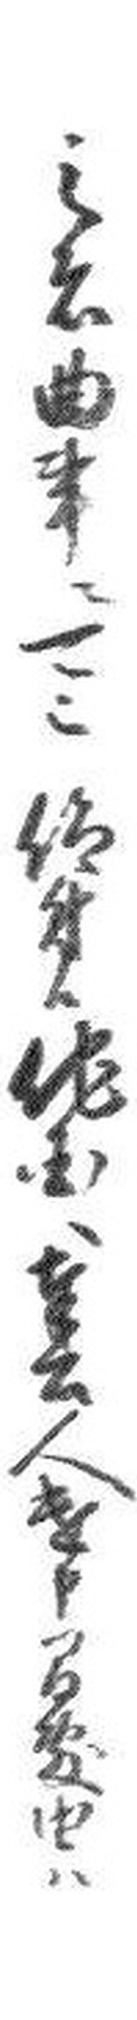之者曲事ニ可被仰付候他国ヘ奉公人遣申間敷由ハ
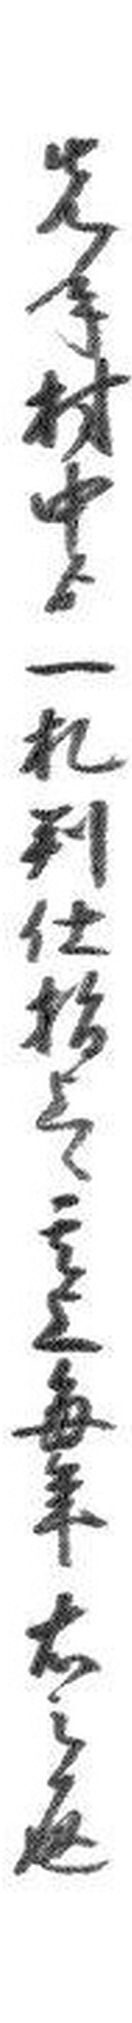先年村中ゟ一札判仕指上候其上毎年右之通
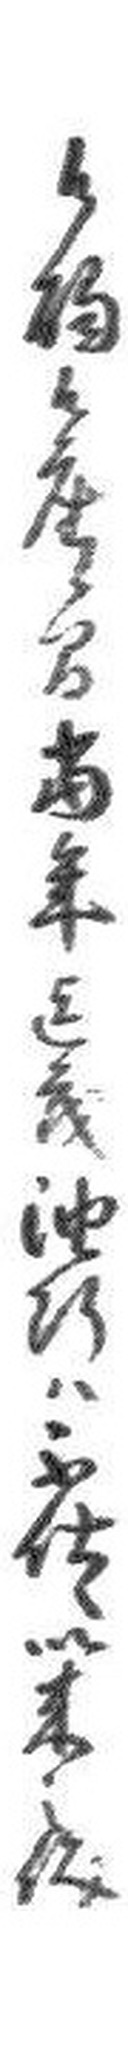御触御座候間当年迄も油断ハ不仕候以来之儀
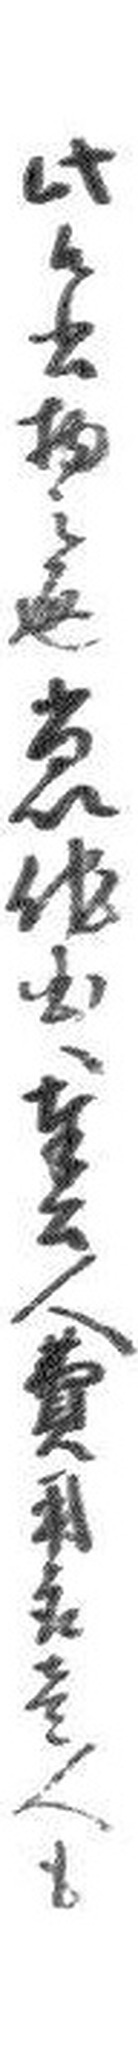此御書物之通尚以他国ヘ奉公人費用取壱人も

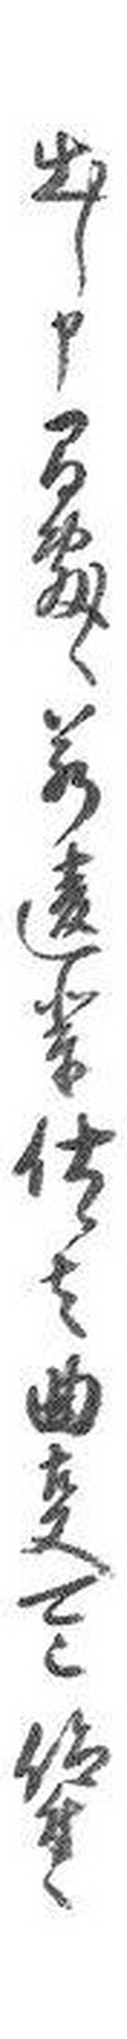出し申間敷候若違背仕候は曲事可被仰付候
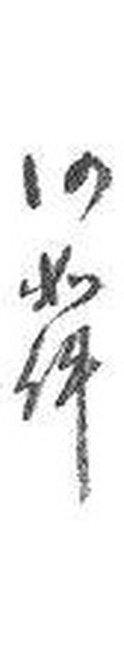仍如件
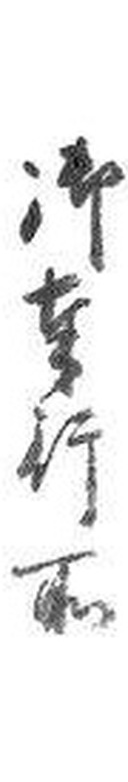御奉行所
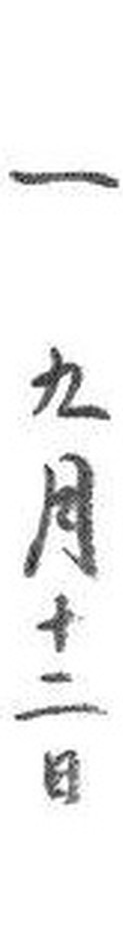一九月十二日
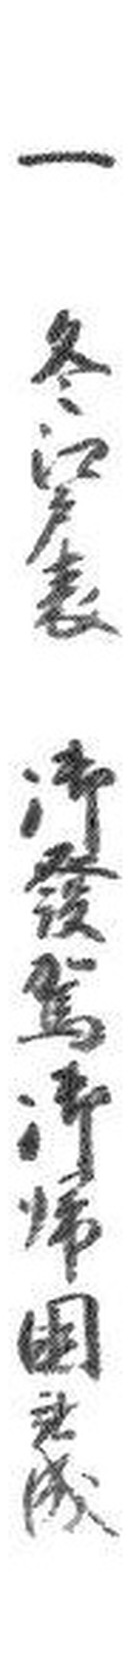一冬江戸表御発駕御帰国被成
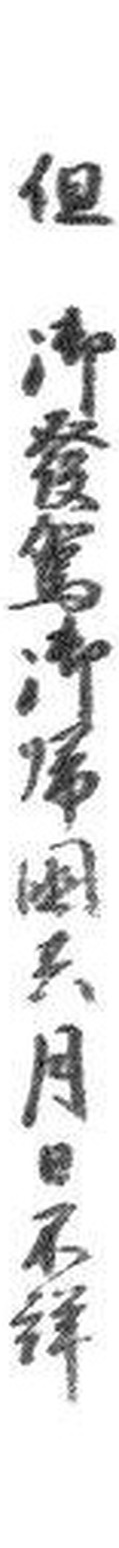但御発駕御帰国共月日不詳

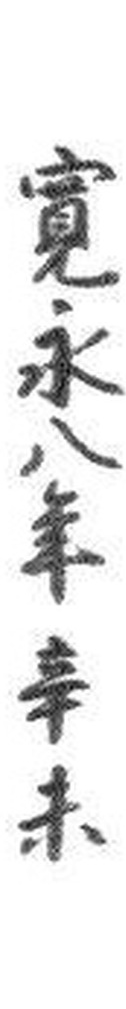寛永八年辛未
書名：家譜 四 忠昌公 従寛永七年到正保四年
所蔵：福井県文書館 Fukui Prefectural Archives
